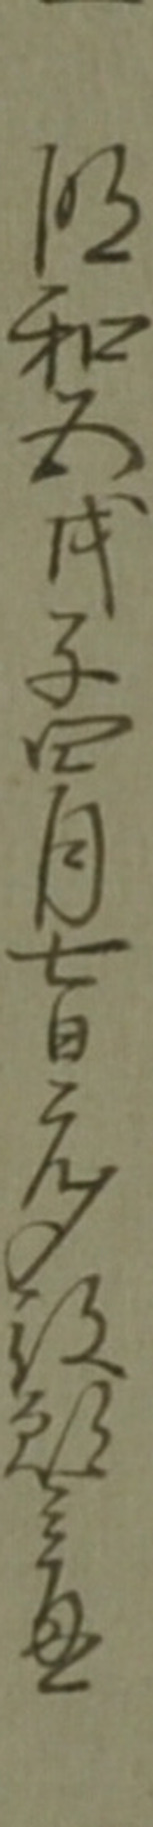一明和五戊子四月七日元〆役願之通
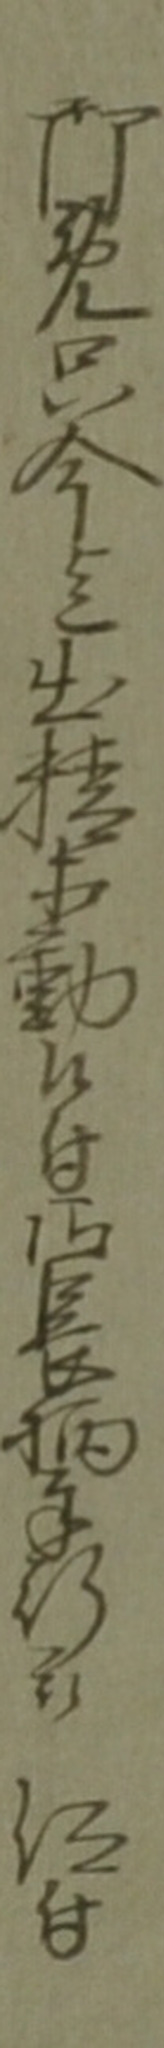御免只今迄出精相勤候付御長柄奉行被仰付
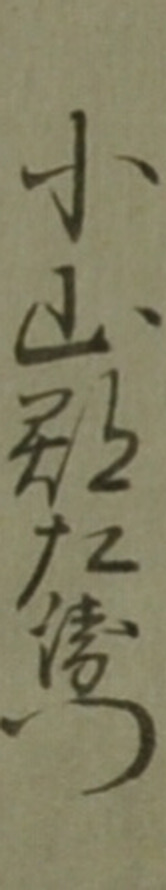小山郡左衛門
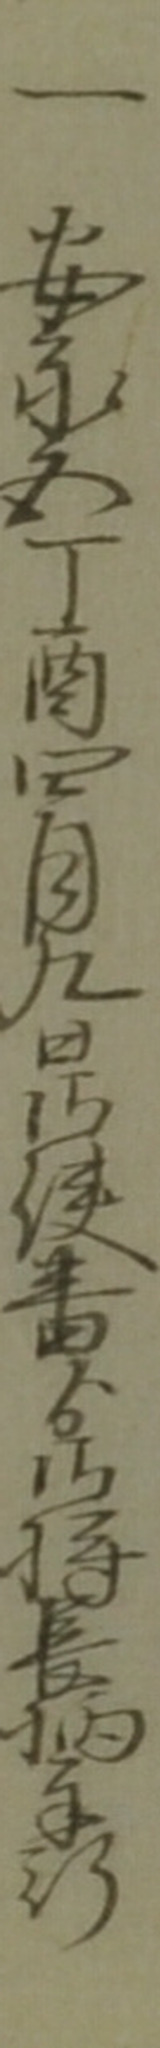一安永五丁酉四月九日御使番ゟ御持長柄奉行
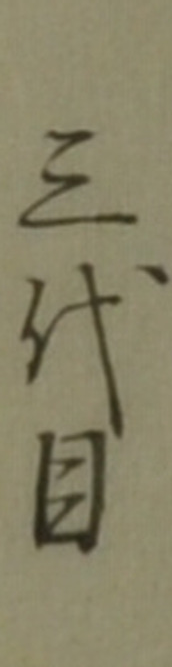三代目
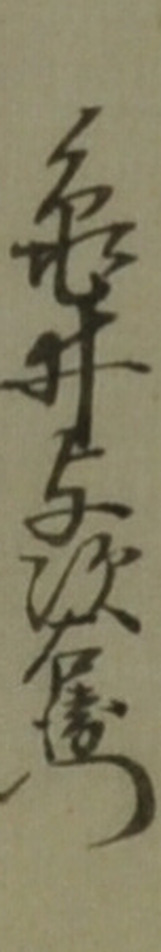亀井与次右衛門
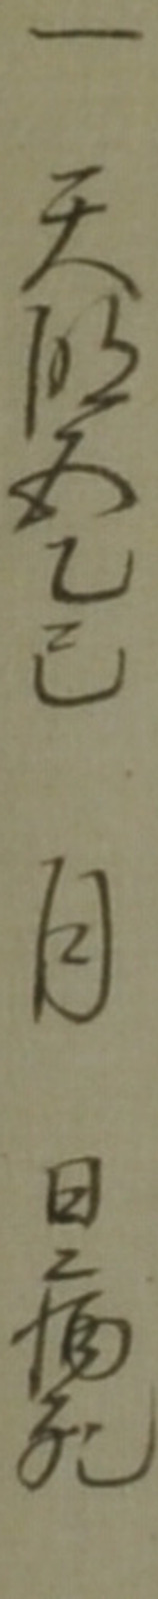一天明五乙巳月日病死
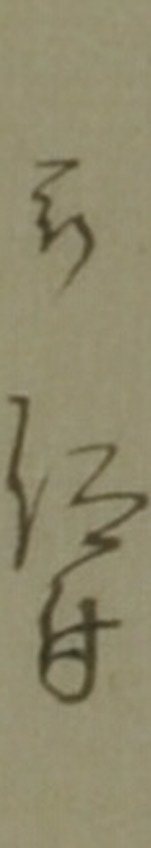被仰付
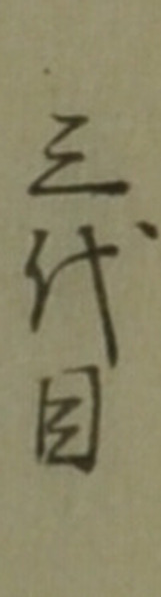三代目
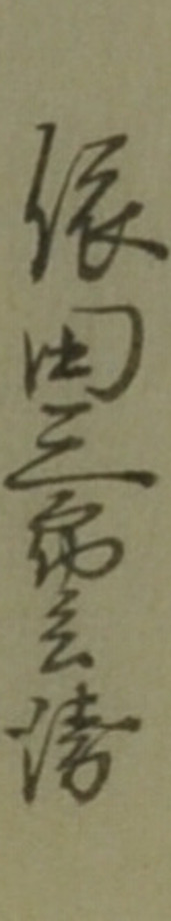依田三郎兵衛
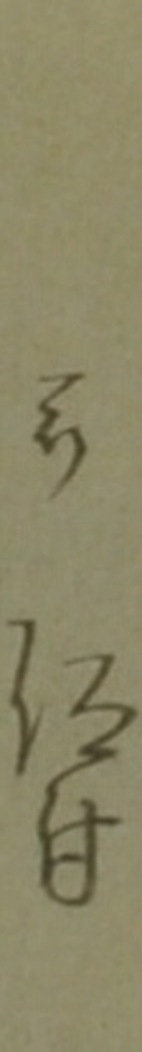被仰付
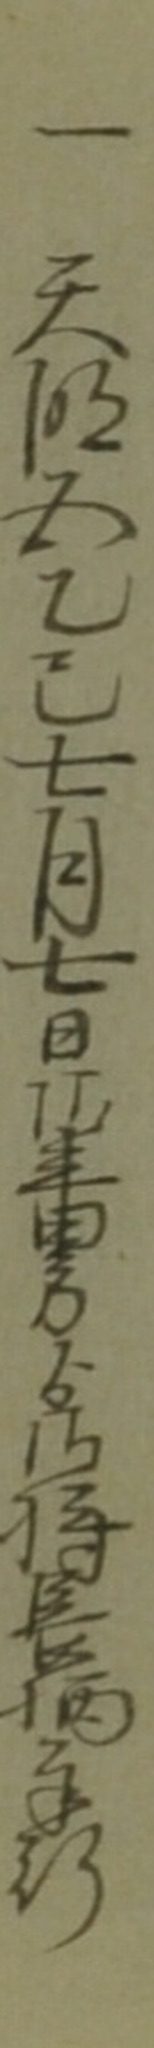一天明五乙巳七月七日御番方ゟ御持長柄奉行
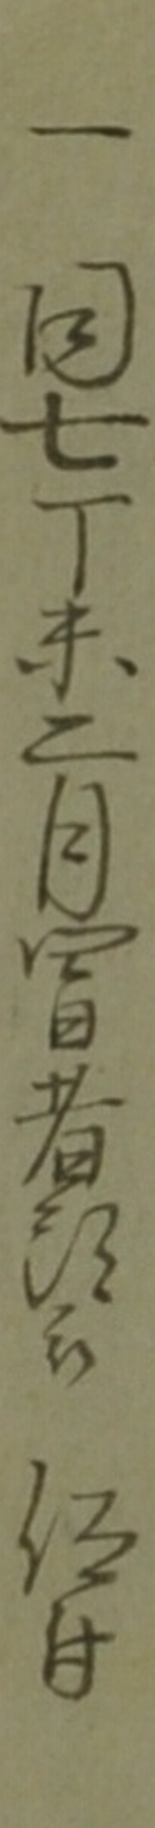一同七丁未二月四日者頭被仰付
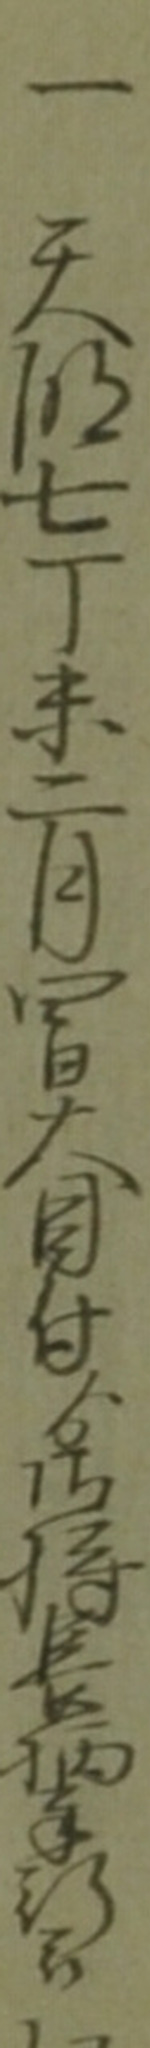一天明七丁未二月四日大目付ゟ御持長柄奉行被仰付
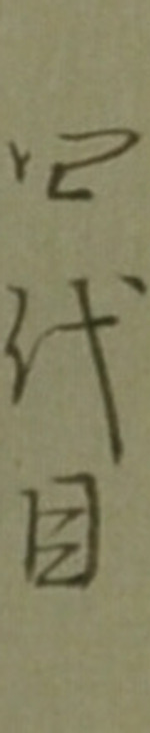四代目
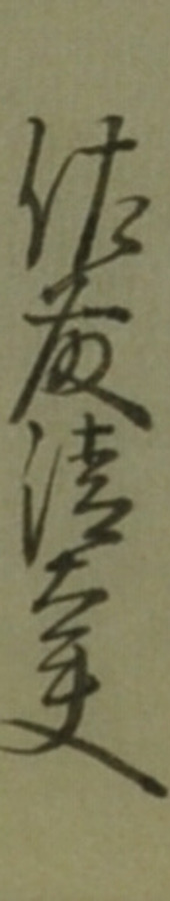佐藤清太夫
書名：諸御役代々録（三）
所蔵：伊那市立高遠町図書館・合同会社AMANE
